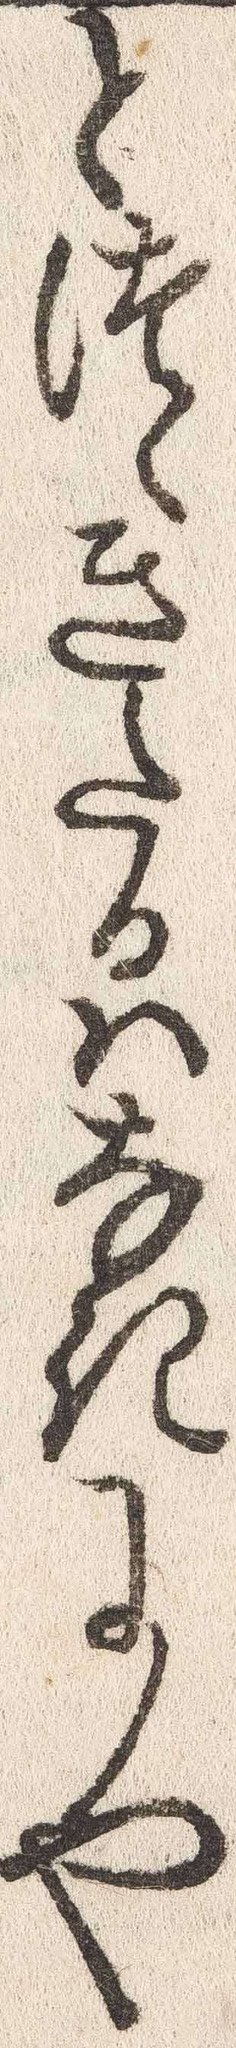とつゝきたるはなきにや
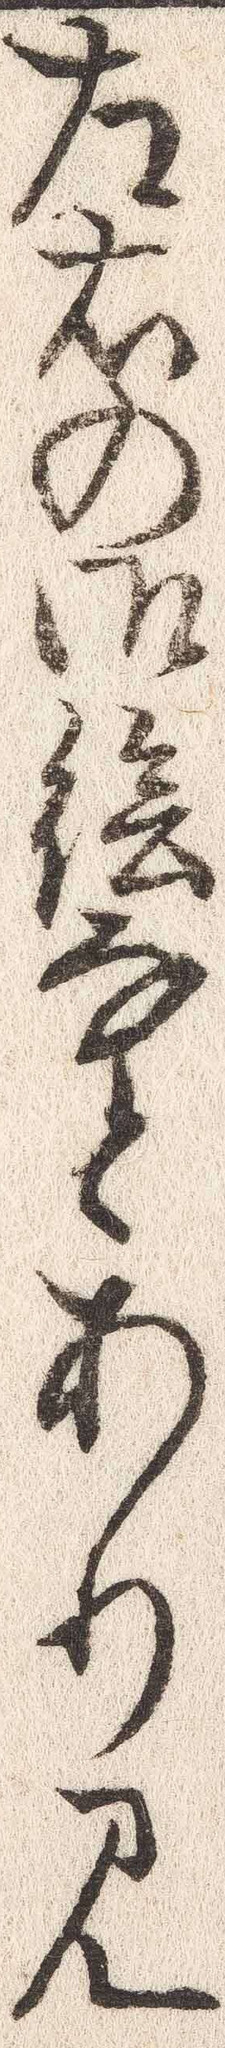左右の御絵なとありみ
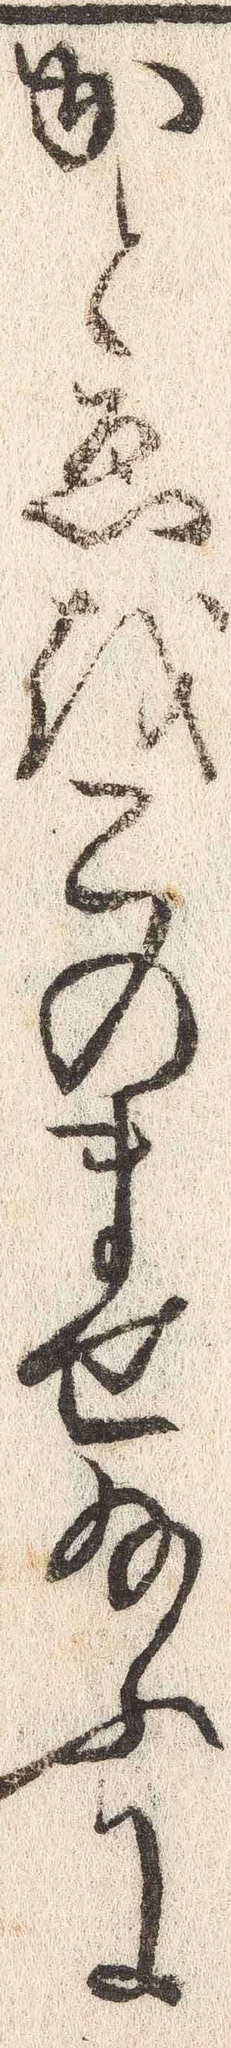かとゑをこのませ給ふに
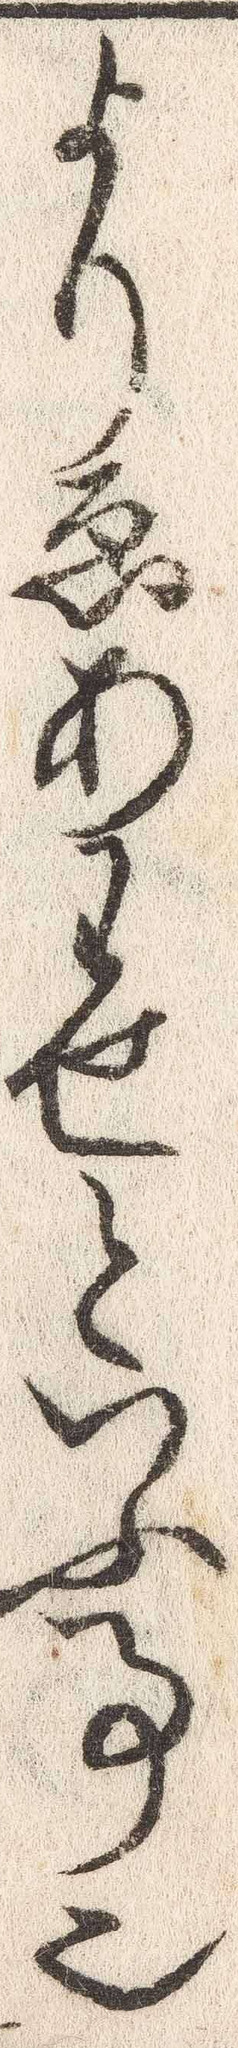よりゑあわせといふ事也
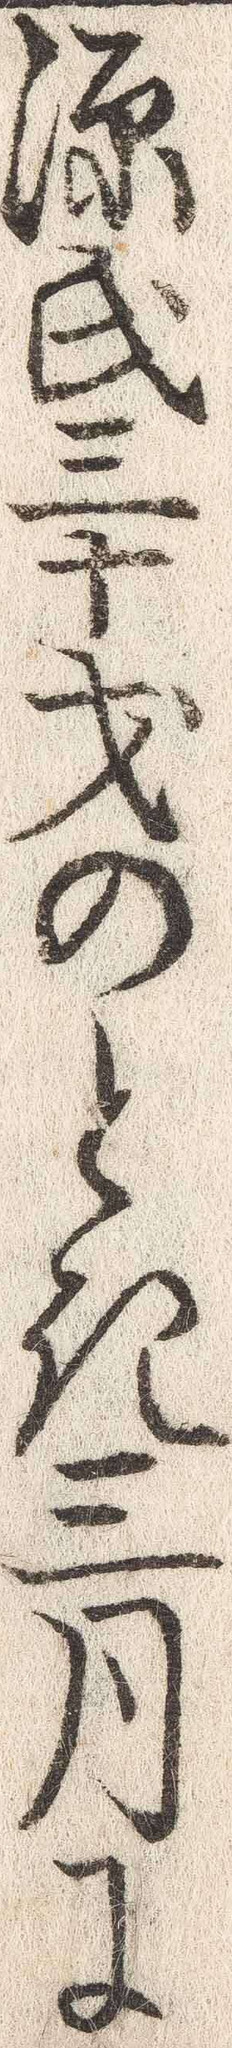源氏三十才のとき三月に
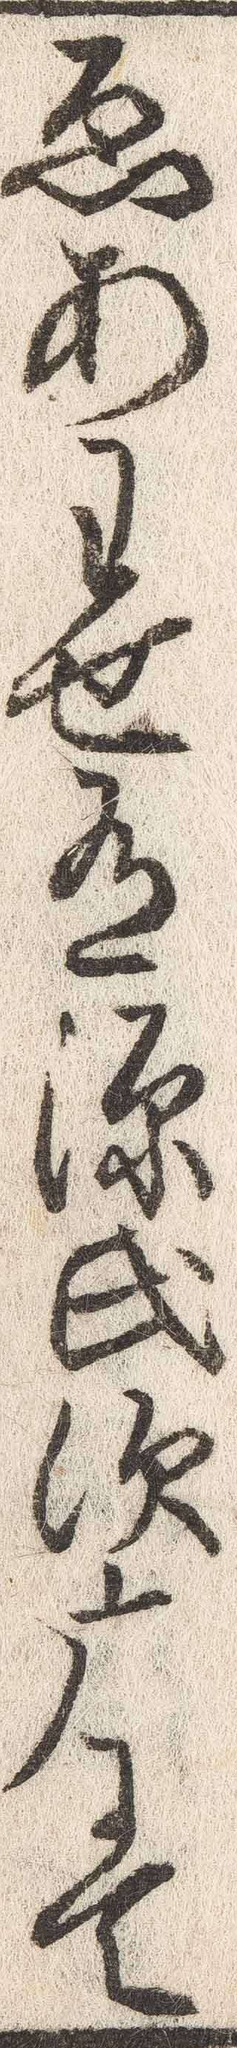ゑあわせ有源氏須磨にて

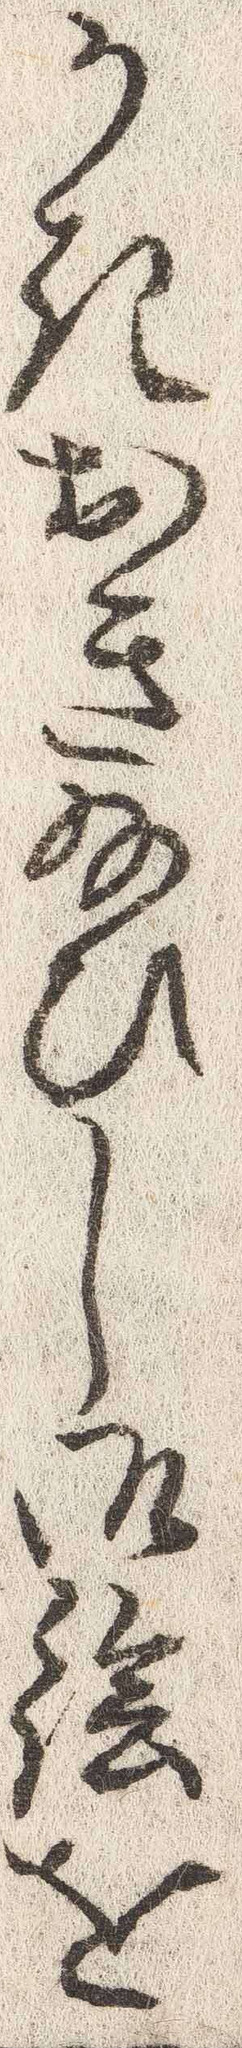かきおき給ひし御絵を
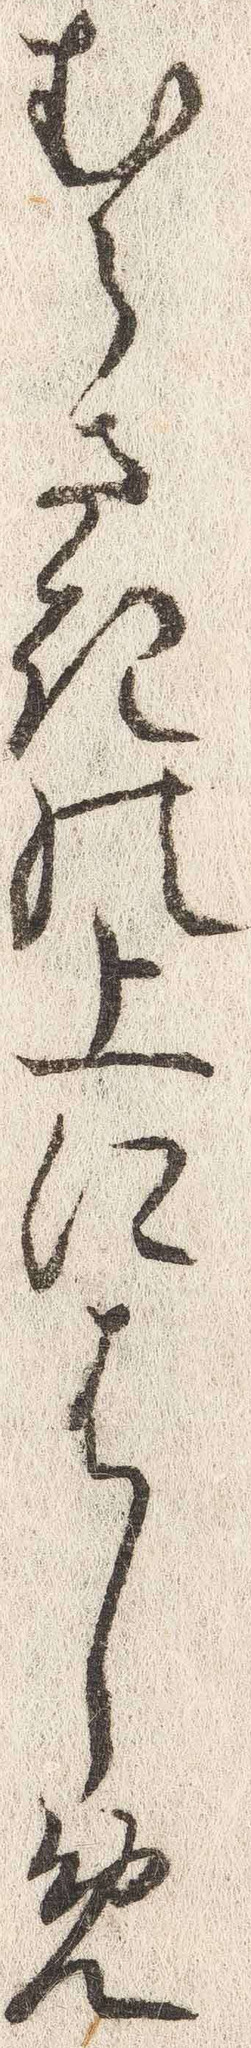むらさきの上にはしめ
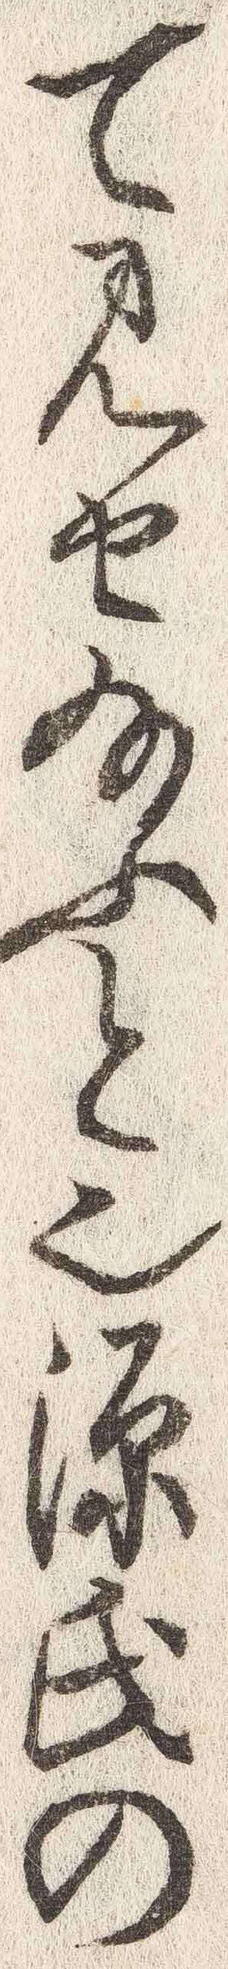て見せ給ふと也源氏の
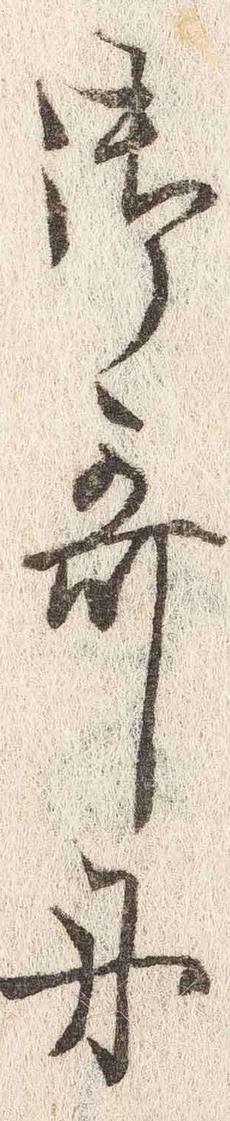御歌に
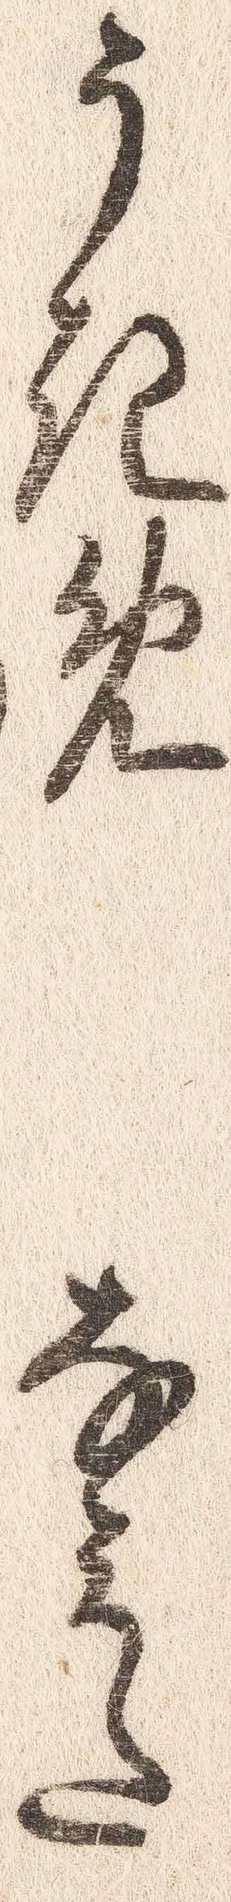うきめなみた
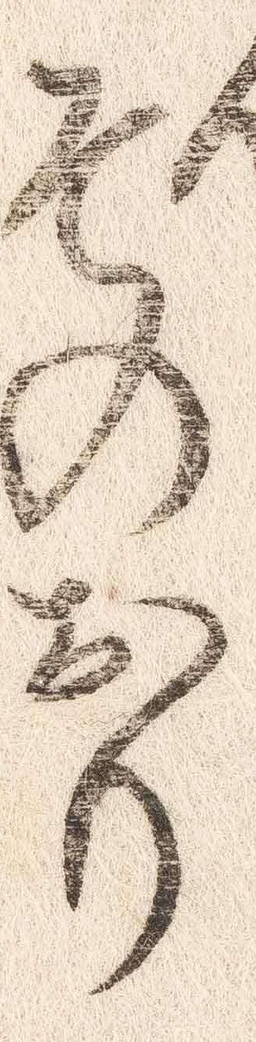そのおり
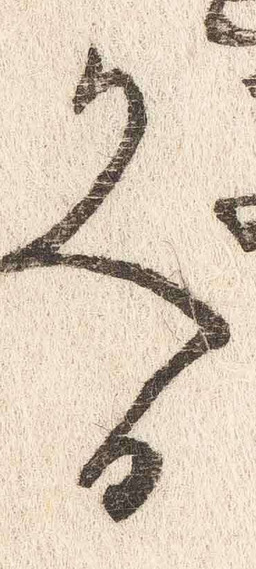かへる

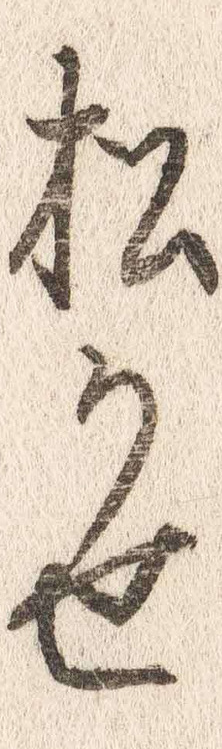松かせ
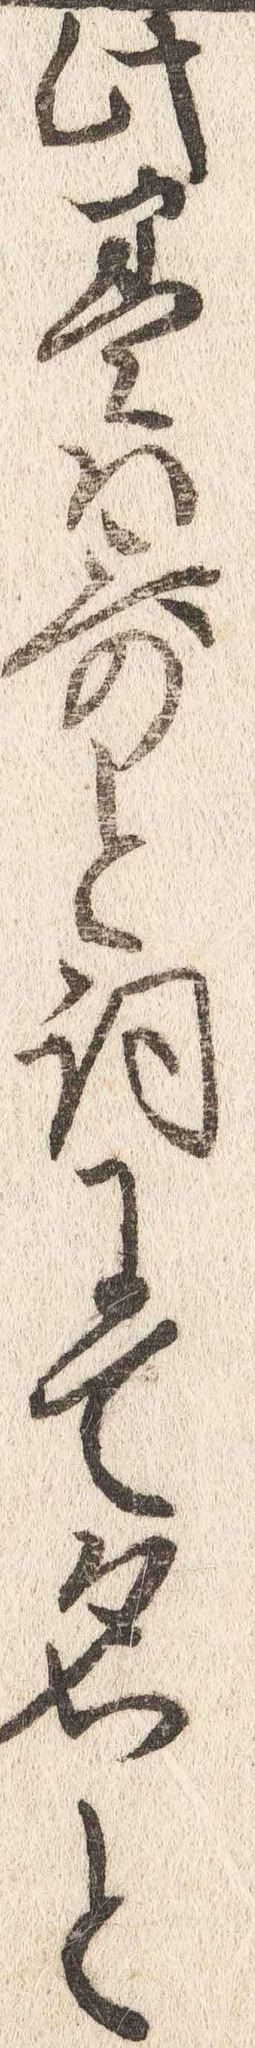此巻は歌と詞にて名と
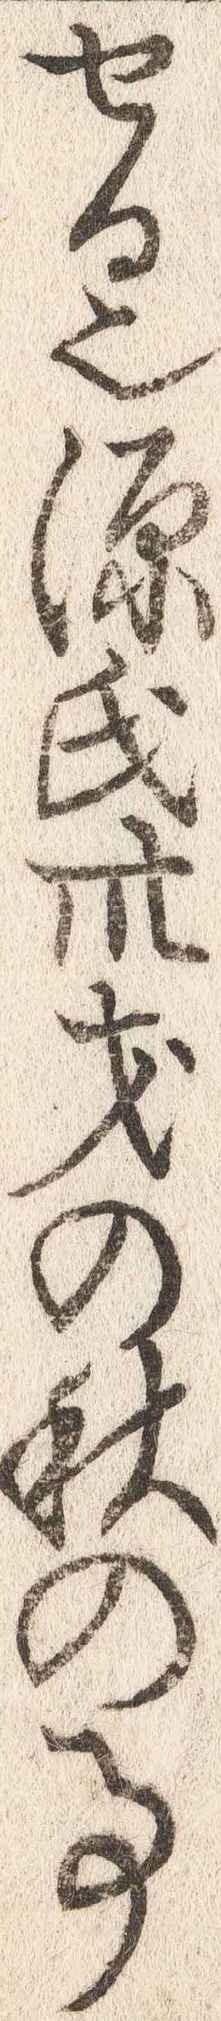せる也源氏卅才の秋の事
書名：源氏物語
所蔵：東京学芸大学附属図書館 国文学研究資料館
